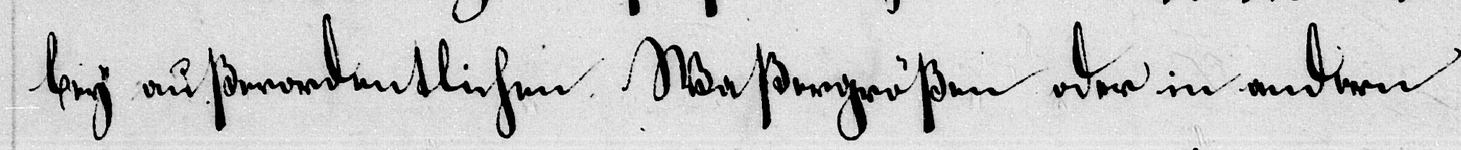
bey außerordentlichen Waßergrößen oder in andern
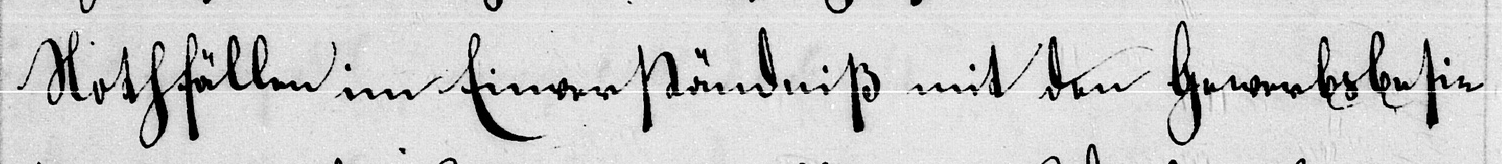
Nothfällen im Einverständniß mit den Gewerbsbesi¬
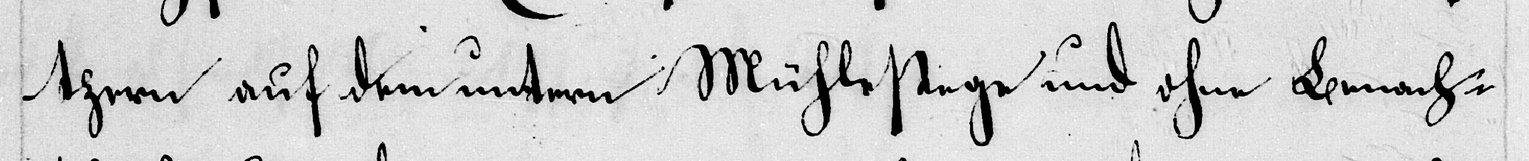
tzern auf dem untern Mühlestege und ohne Benach¬
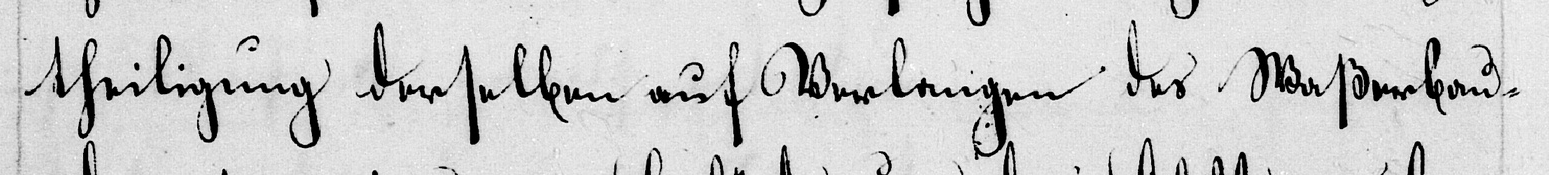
theiligung derselben auf Verlagen des Waßerba¬
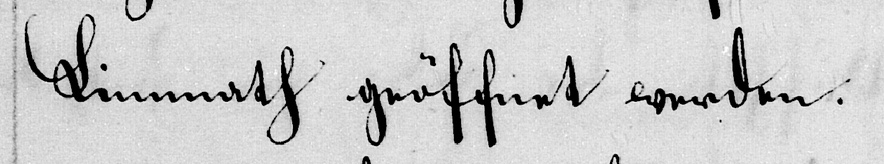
Limmath geöffnet werden.
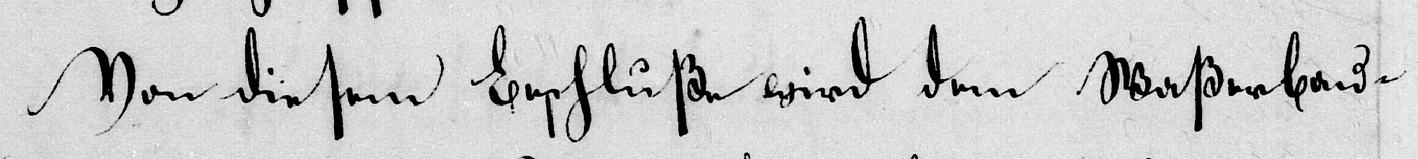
Von diesem Beschluße wird dem Waßerba¬
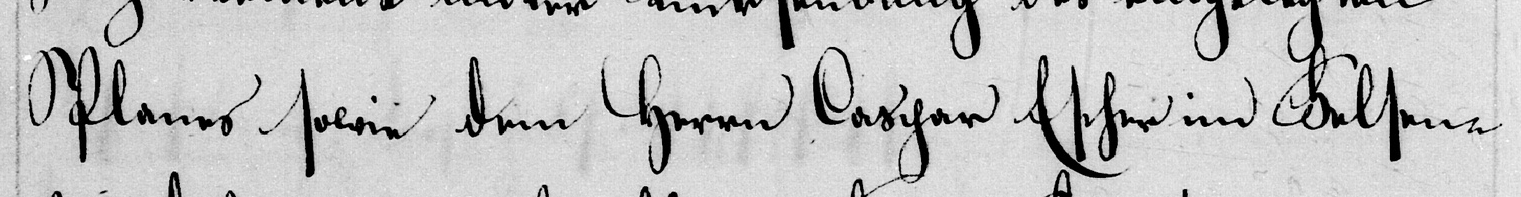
Planes sowie dem Herrn Caspar Escher im Felsen¬
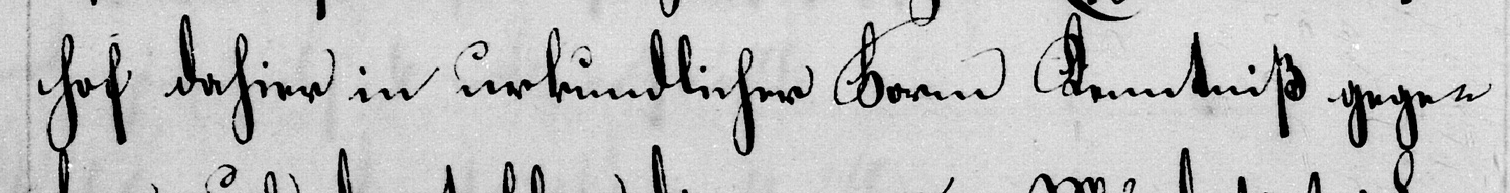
hof dahier in urkundlicher Form Kenntniß gege¬
